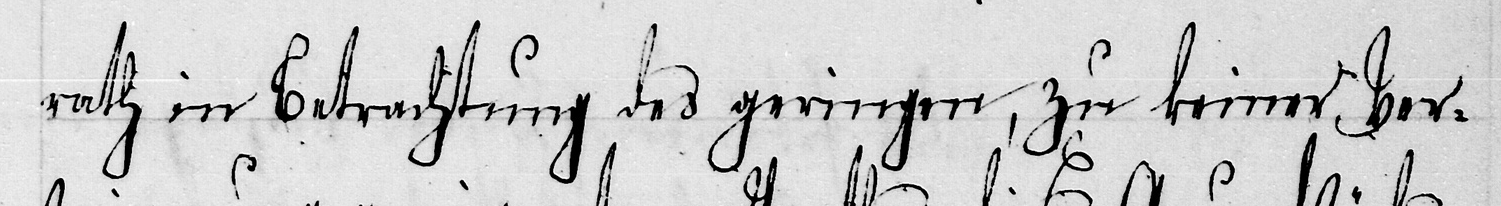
rath in Betrachtung des geringen, zu keiner Ver¬
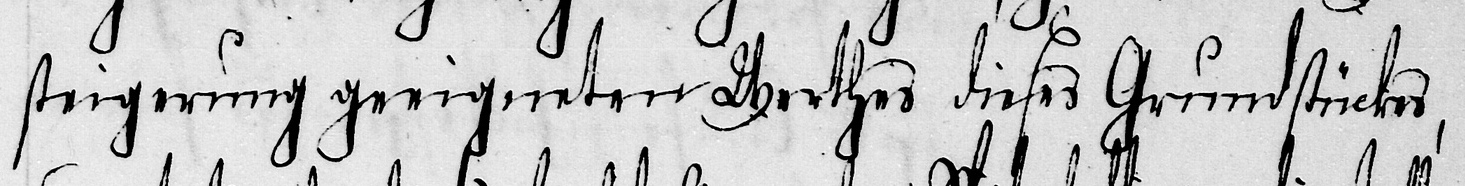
steigerung geeigneten Werthes dieses Grundstückes,
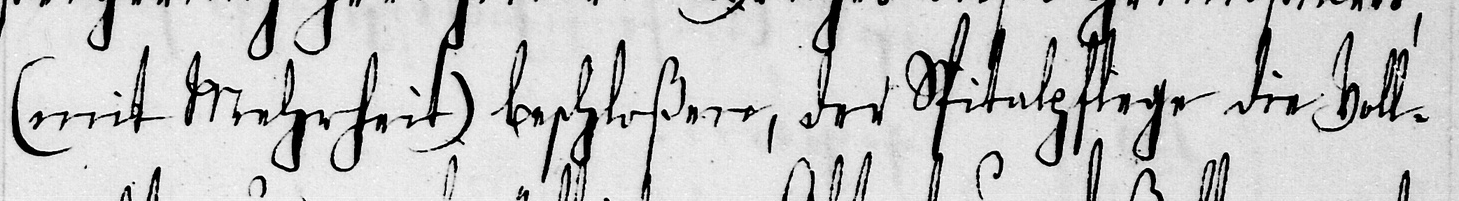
(mit Mehrheit) beschloßen, der Spitalpflege die Vol¬
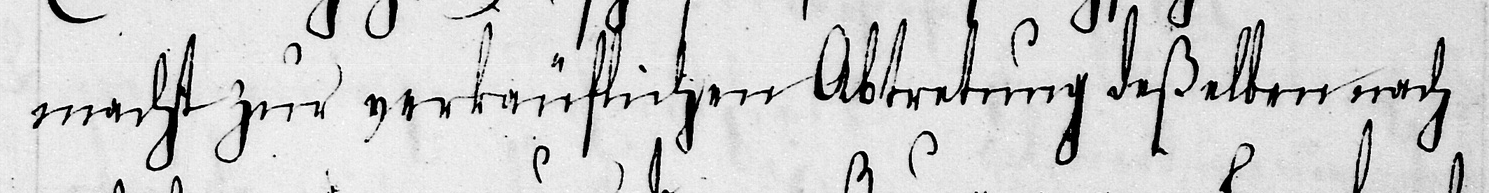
lmacht zur verkäuflichen Abtretung deßelben nach
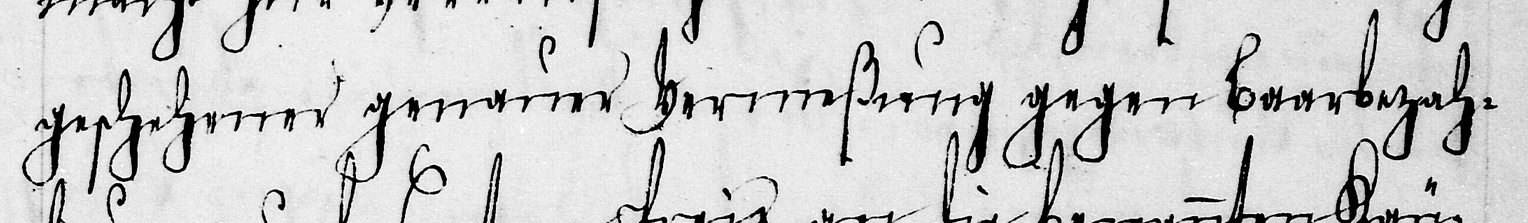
geschehener genauer Vermeßung gegen Baarbezah¬
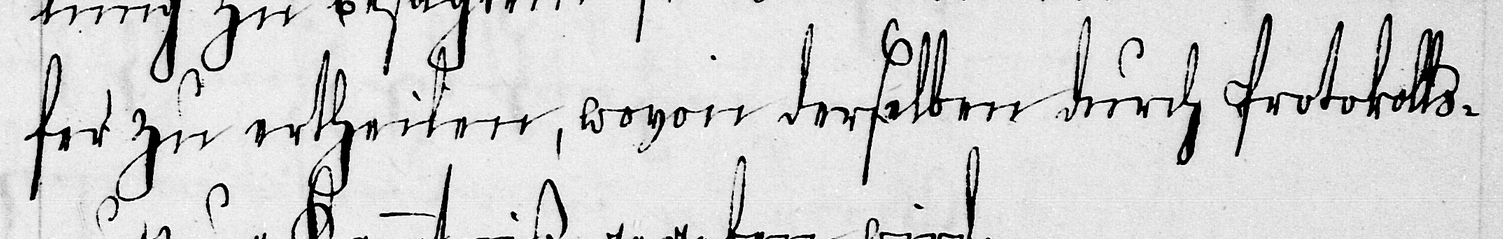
fer zu ertheilen, wovon derselben durch Protokoll¬
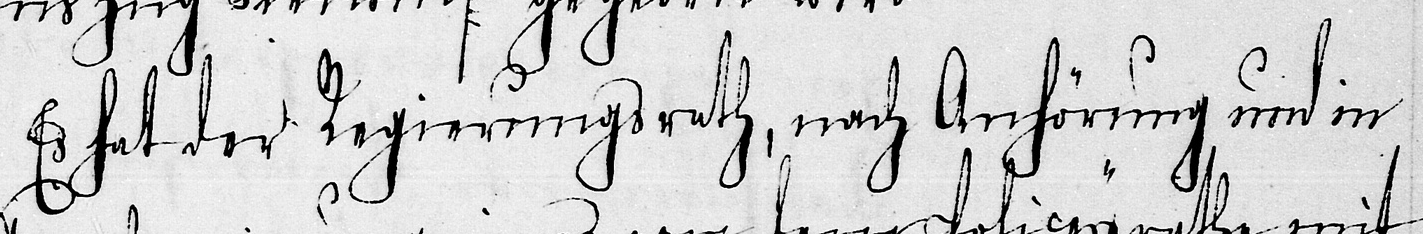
Es hat der Regierungsrath, nach Anhörung in
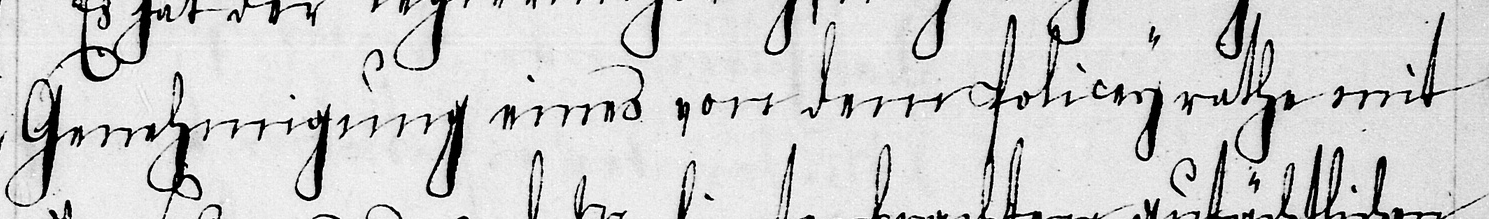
Genehmigung eines von dem Policeyrathe mit
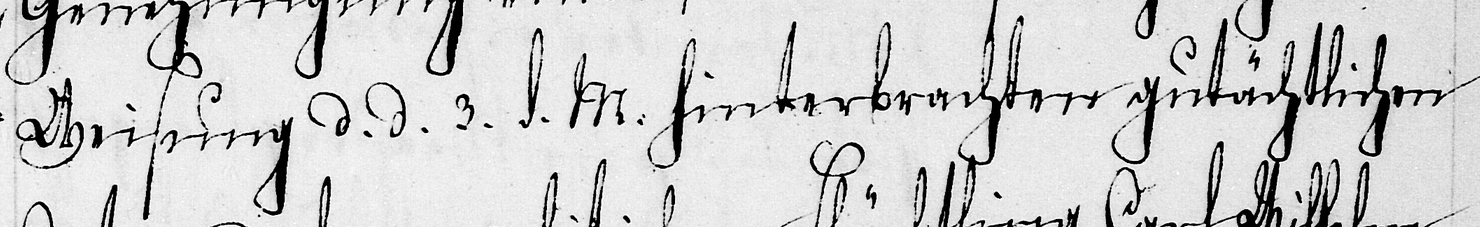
Weisung d. d. 3. d. M. hinterbrachten gutächtlichen
